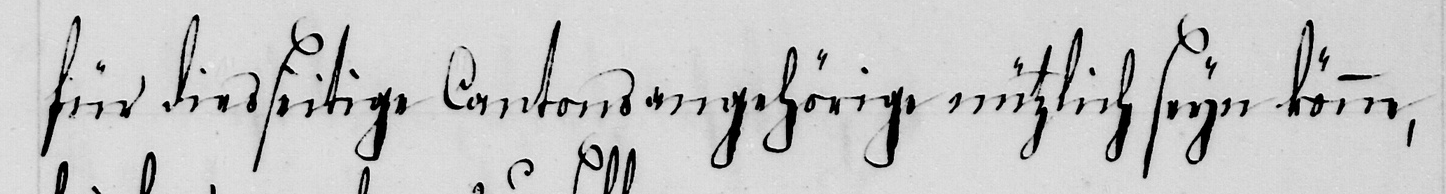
für diesseitige Cantonsangehörige nützlich seyn könne,
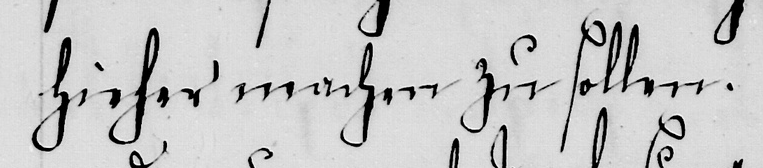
hieher machen zu sollen.
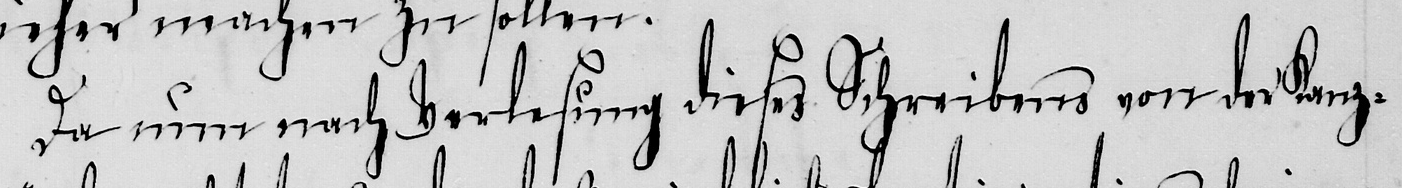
Da nun nach Verlesung dieses Schreibens von der Kanz¬
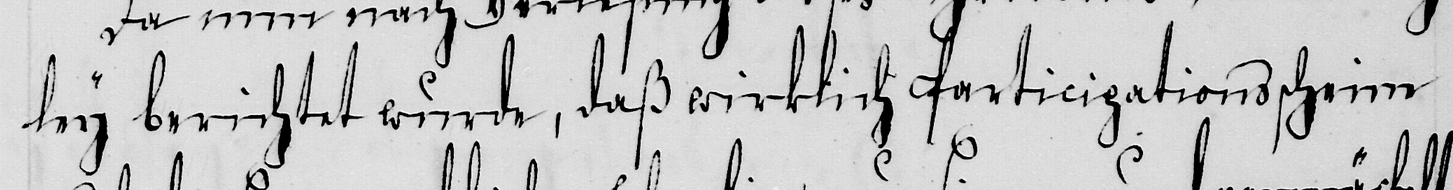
ley berichtet wurde, daß wirklich Participationsscheine
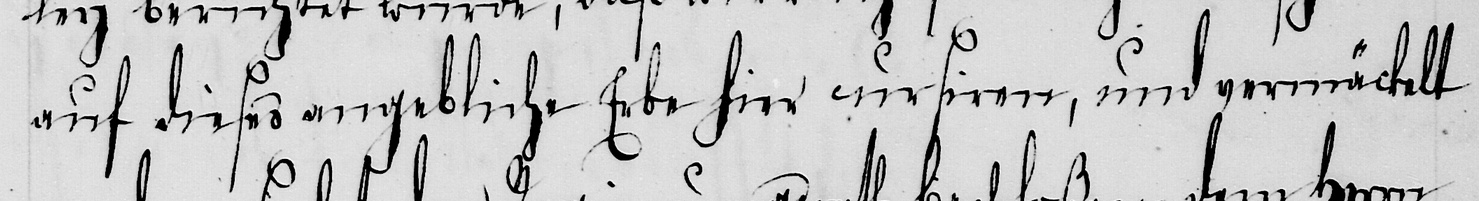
auf dieses angebliche Erbe hier cursiren, und vermäckelt
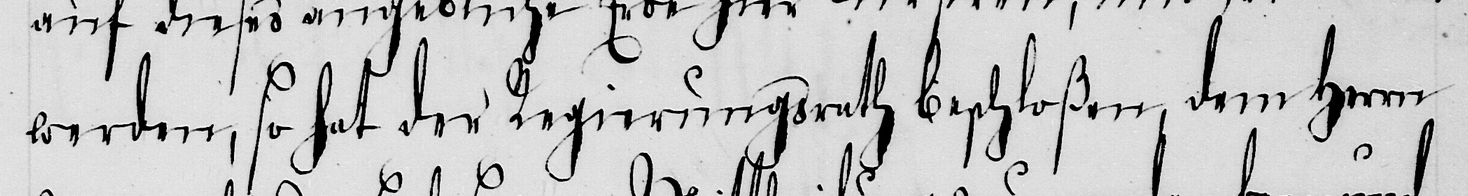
werden, so hat der Regierungsrath beschloßen, dem Herrn
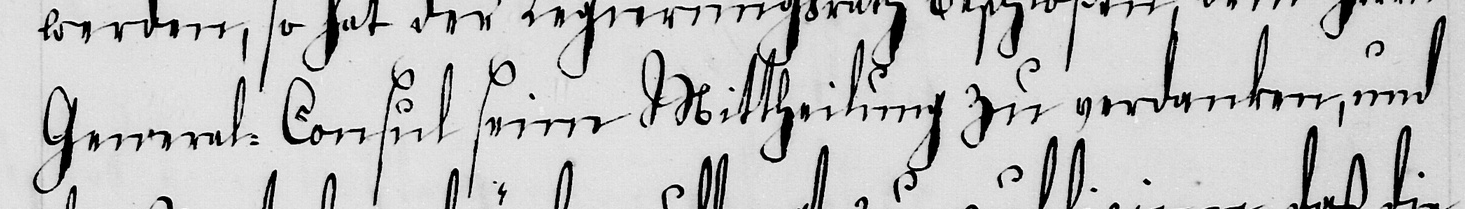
General-Consul seine Mittheilung zu verdanken, und
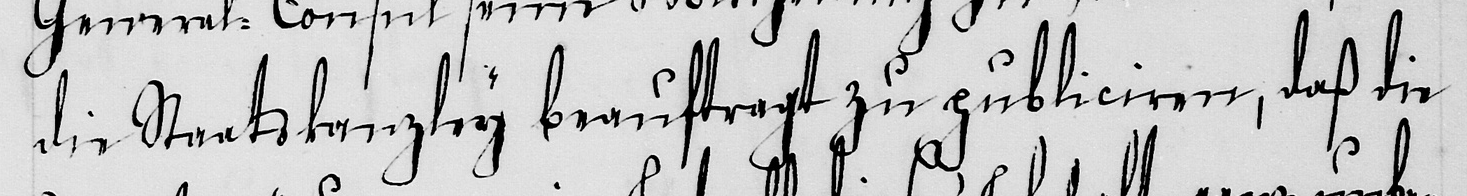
die Staatskanzley beauftragt zu publiciren, daß die
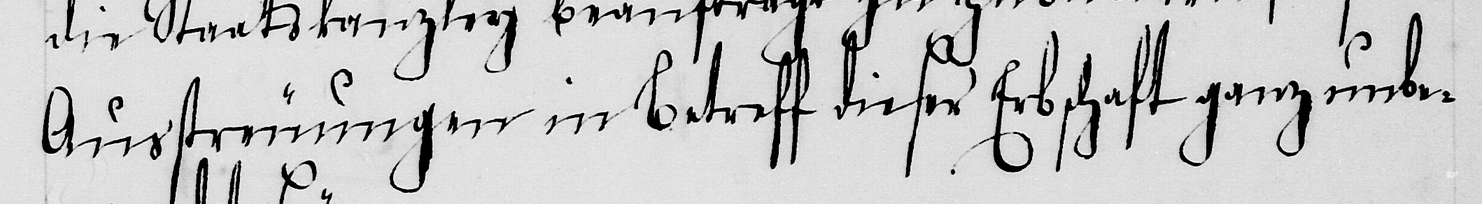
Ausstreuungen in Betreff dieser Erbschaft ganz unbe¬
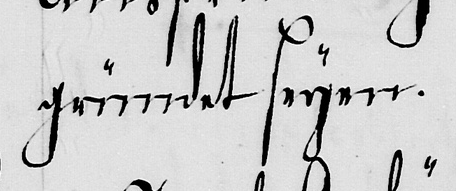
gründet seyen.
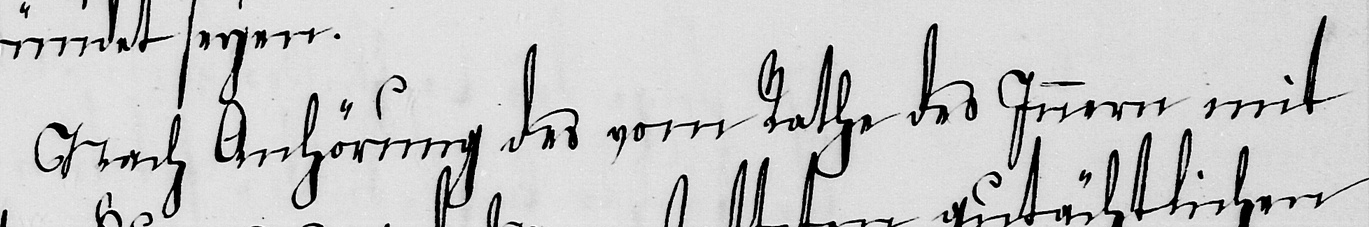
Nach Anhörung des vom Rathe des Innern mit
